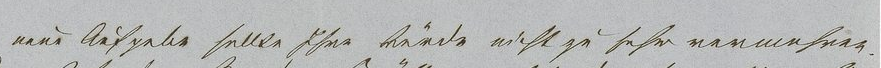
neue Aufgabe sollte Ihre Bürde nicht zu sehr vermehren.
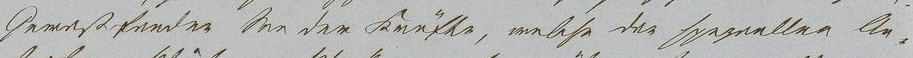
Gewiß finden Sie der Kräfte, welche die speziellen Ar-
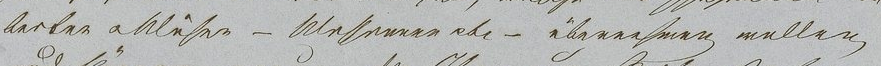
beiten & Mühen – Missionen etc. – übernehmen wollen
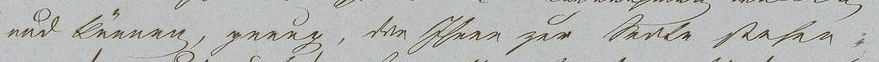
und können, genug, die Ihnen zur Seite stehen
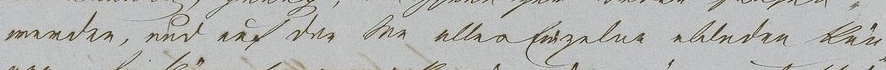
werden, und auf die Sie alles Einzelne abladen kön-
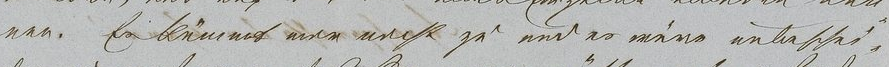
nen. Es kömmt mir nicht zu und es wäre unbeschei-
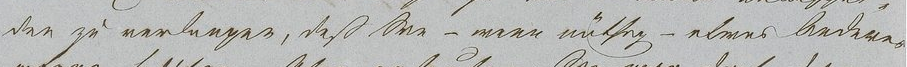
den zu verlangen, daß Sie – wenn nöthig – etwas Anderes
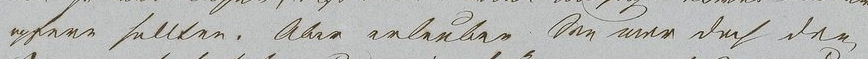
opfern sollten. Aber erlauben Sie mir doch die
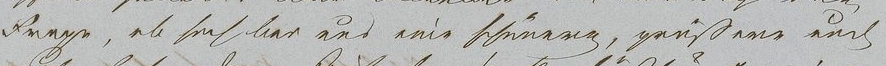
Frage, ob sich bei uns eine schönere, größere und
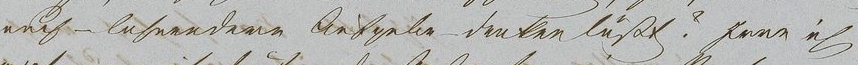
auch – lohnendere Aufgabe denken läßt? Irre ich
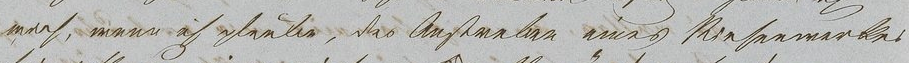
mich, wenn ich glaube, das Anstreben eines Riesenwerkes
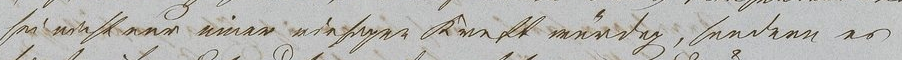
sei nicht nur einer riesigen Kraft würdig, sondern es
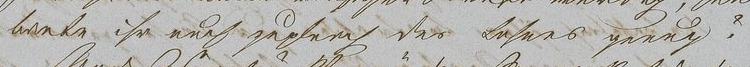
werde ihr auch zugleich des Lohnes genug?
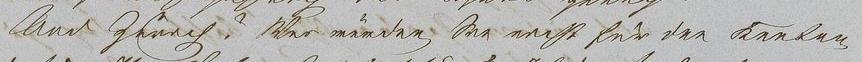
Und Zürich? Was würden Sie nicht für den Kanton
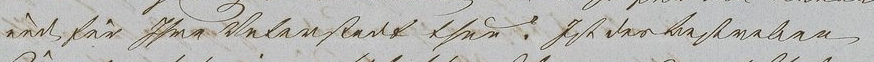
und für Ihre Vaterstadt thun? I st das Bestreben
